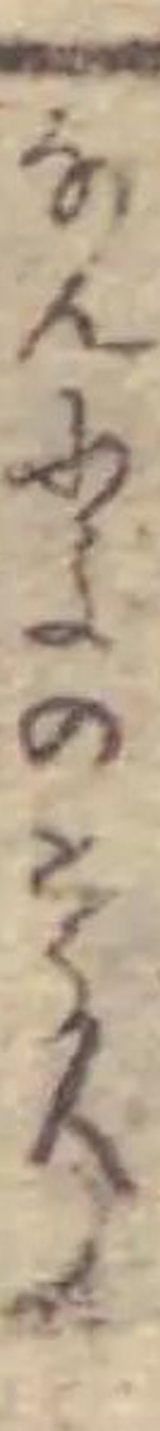なんによのとう人
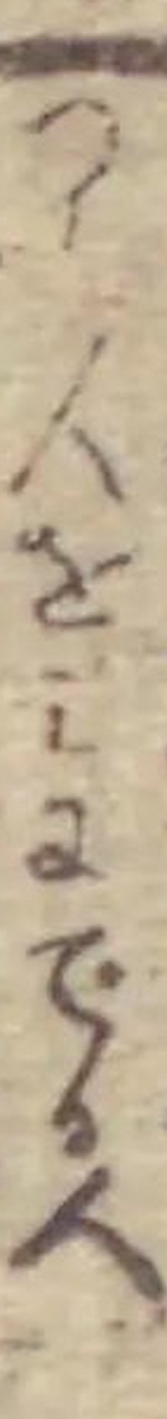つう人をみにでる人
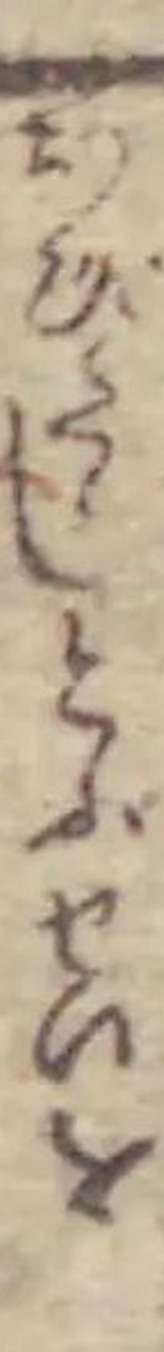おびたゝしとふせいを
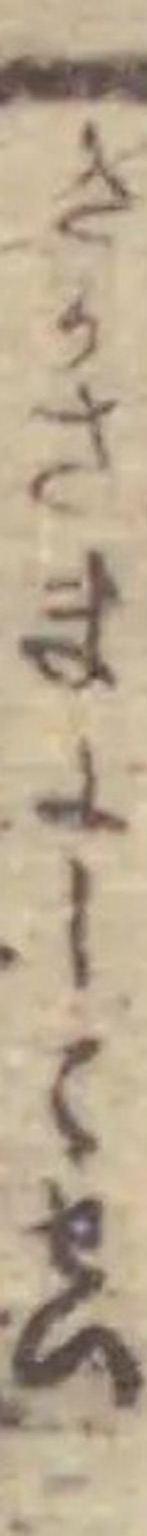さかさまにしてせい
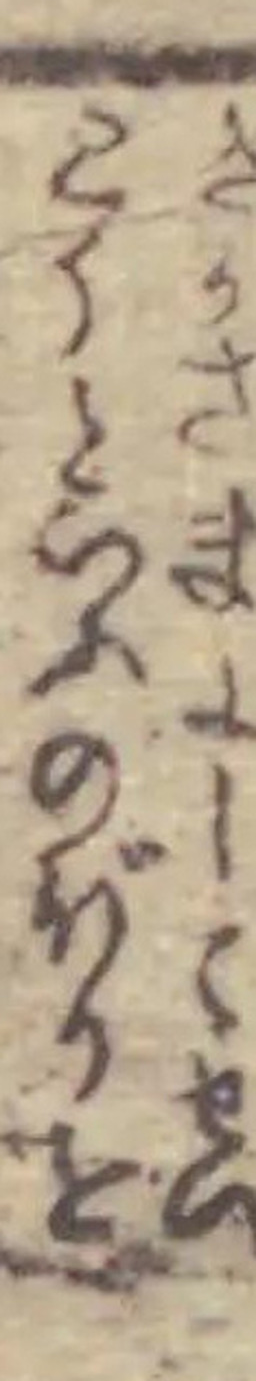とうといふのぼりを
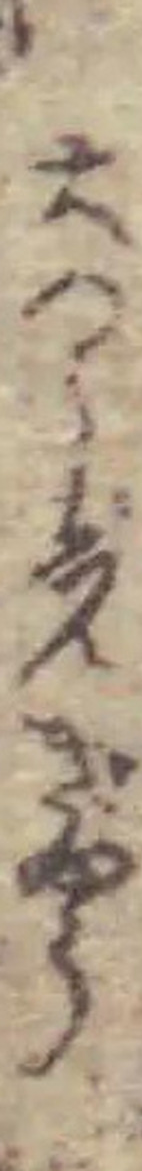大つうじんぎやう
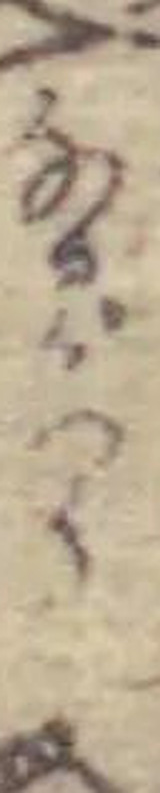なるがつう
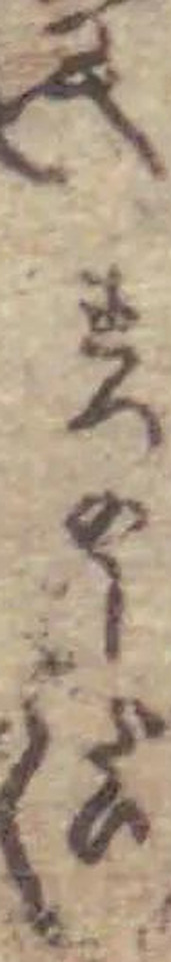れつのしだい
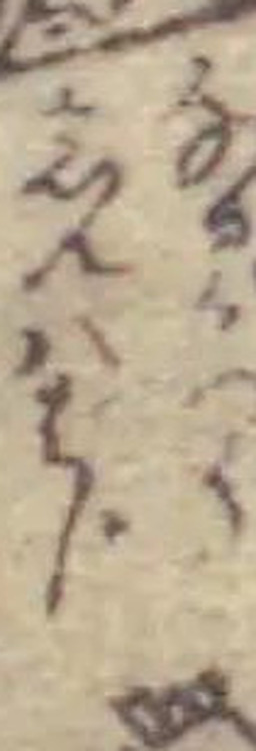しんははじ
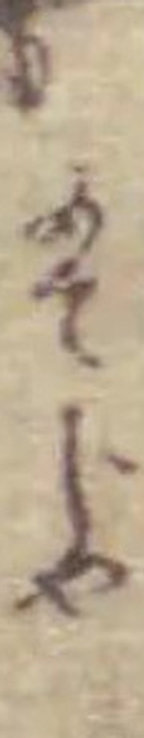めてじや

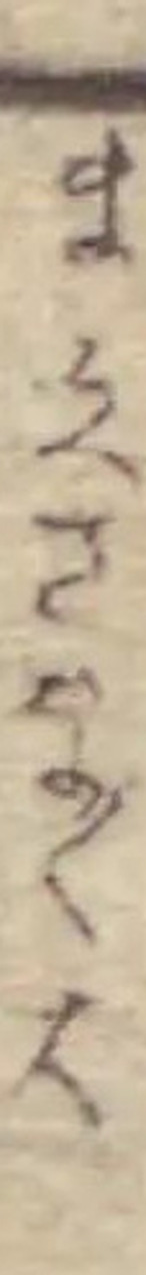まみへさま〳〵大
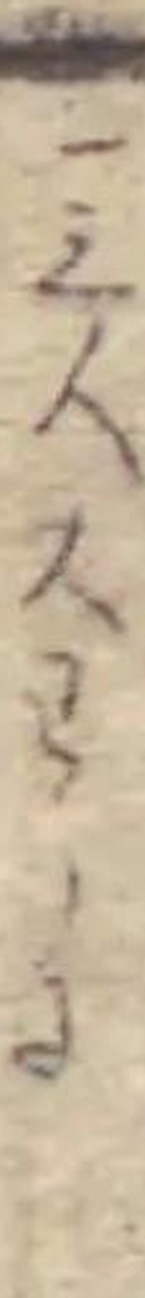二三人大わうに
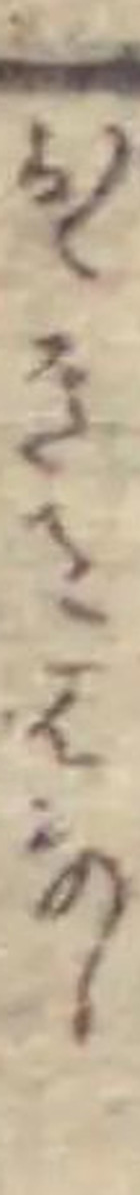おゝきをはなし
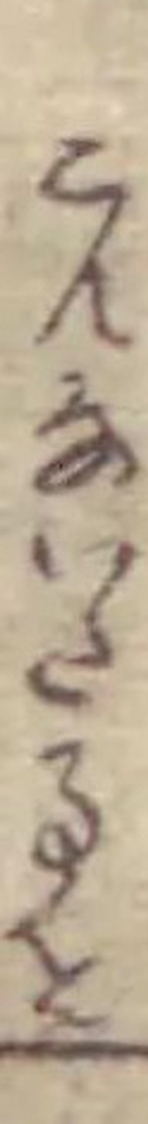こんないた事を
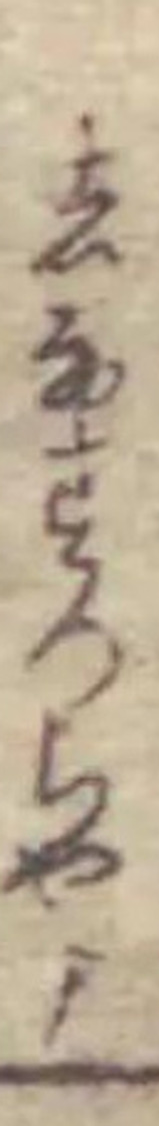しなすつちやァ
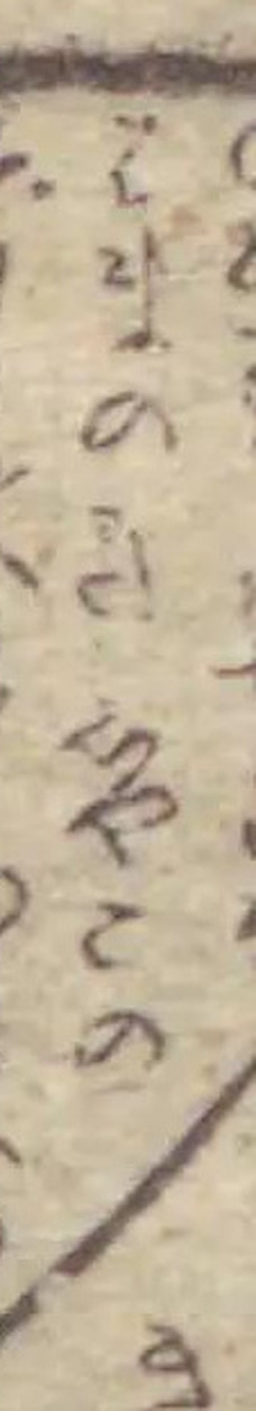はまのきしやこの
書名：茶羅毛通人 3巻
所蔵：国立国会図書館 National Diet Library, JAPAN
